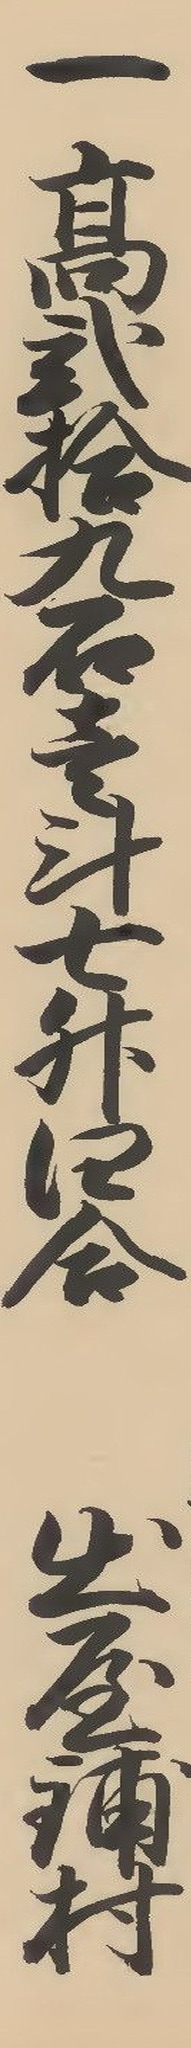一髙弐拾九石壱斗七升四合出屋鋪村
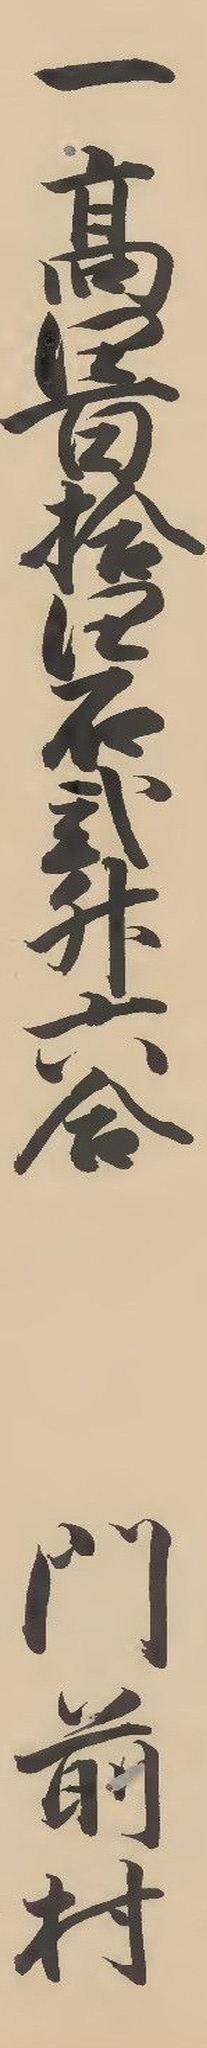一髙四百拾四石弐升六合門前村
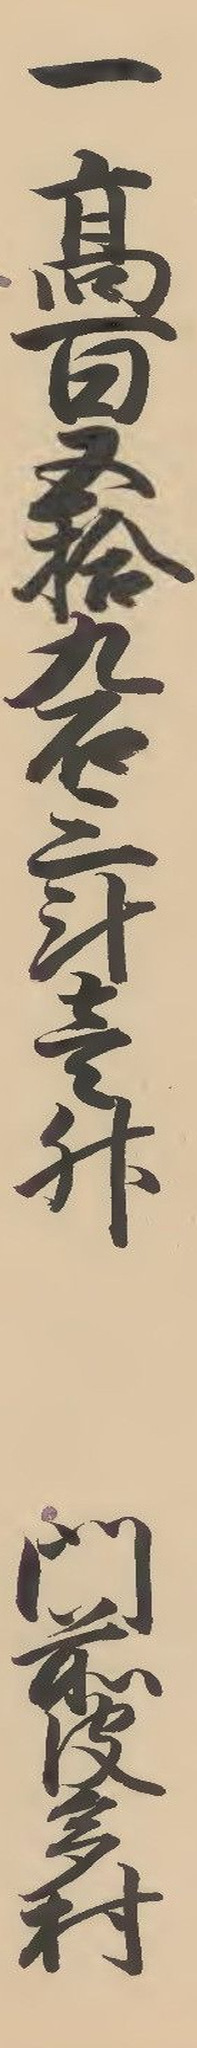一髙百五拾九石三斗壱升門前皮多村

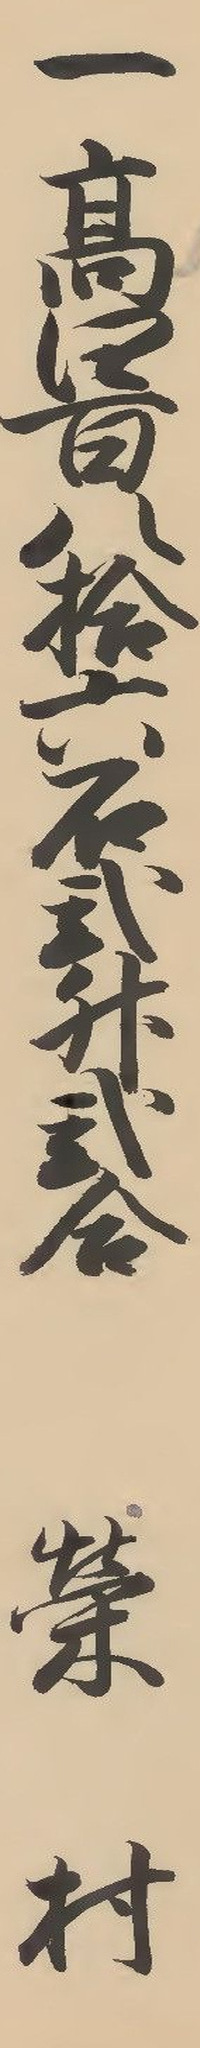一髙四百八拾六石弐升弐合榮村
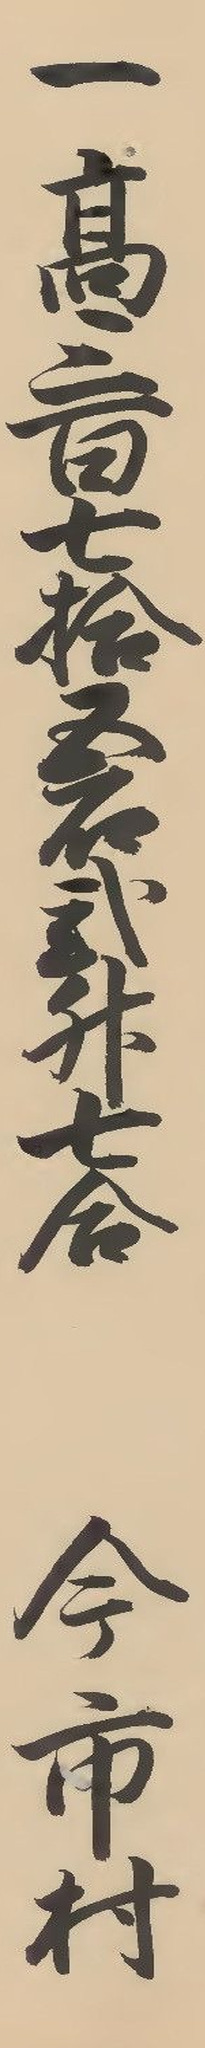一髙三百七拾五石弐升七合今市村
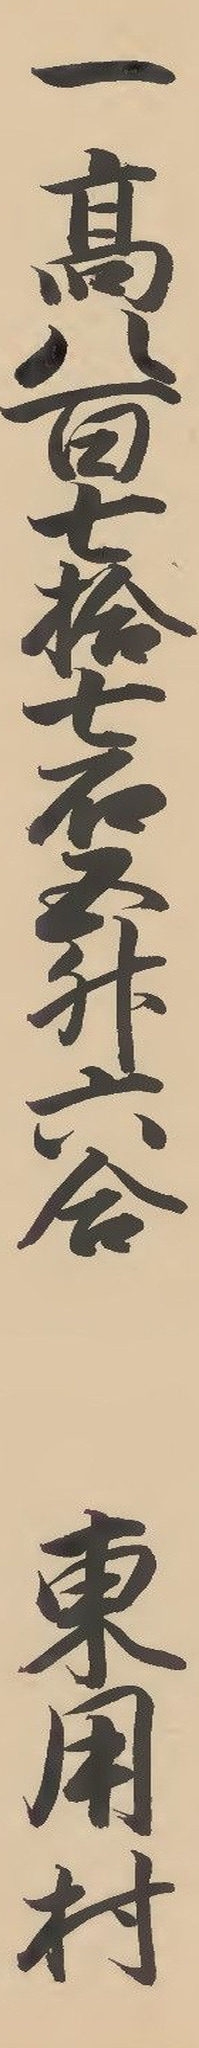一髙八百七拾七石五升六合東用村
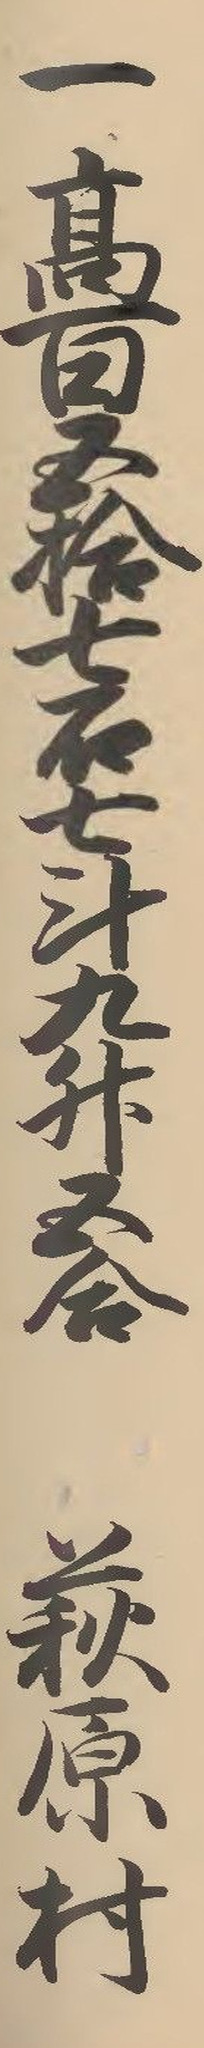一髙百五拾七石七斗九升五合萩原村
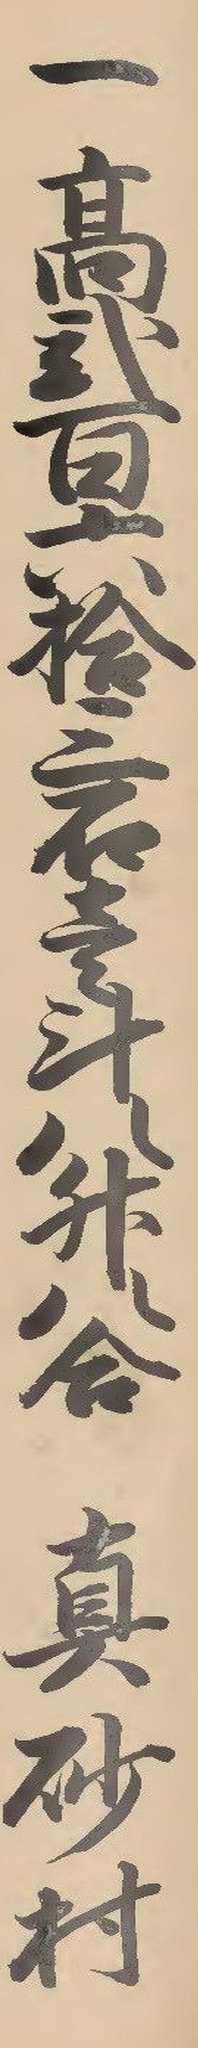一髙弐百六拾三石壱斗八升八合真砂村
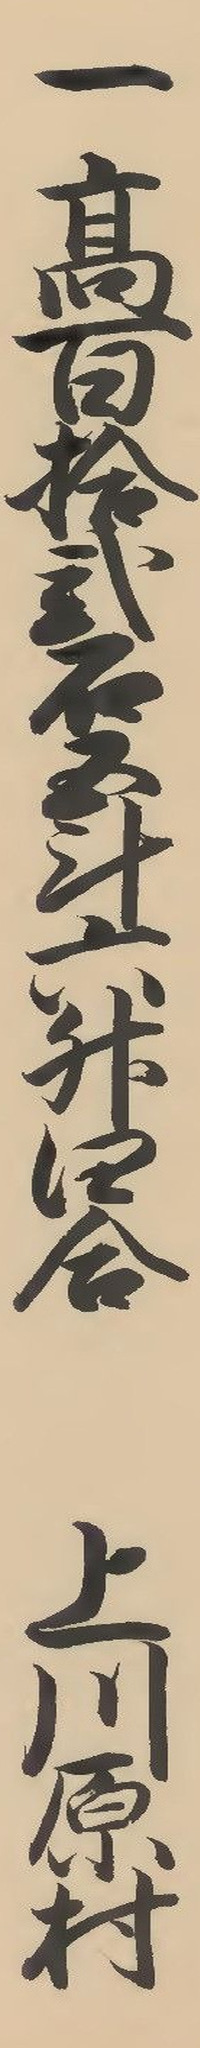一髙百拾弐石五斗六升四合上川原村
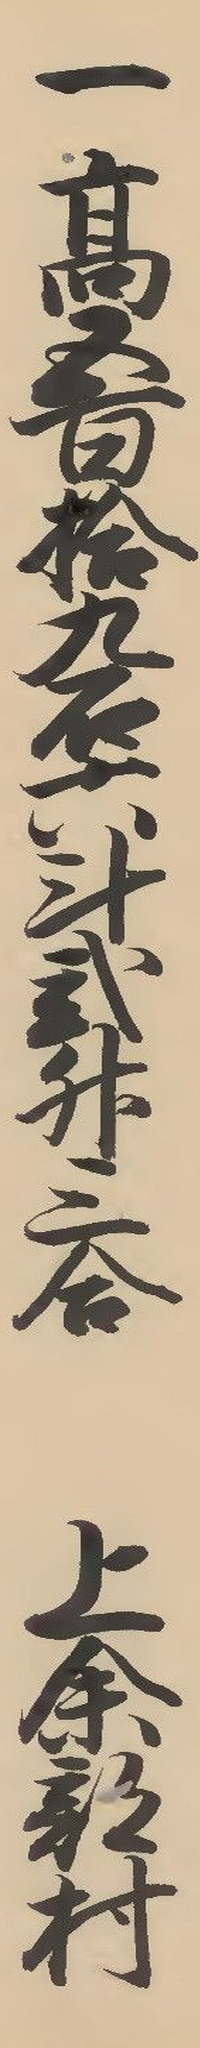一髙五百拾九石六斗弐升三合上余部村
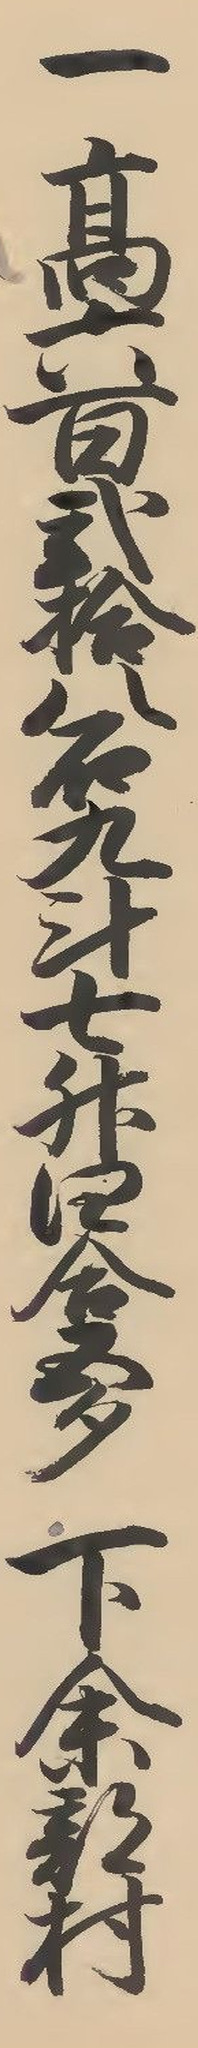一髙六百弐拾八石九斗七升四合五夕下余部村

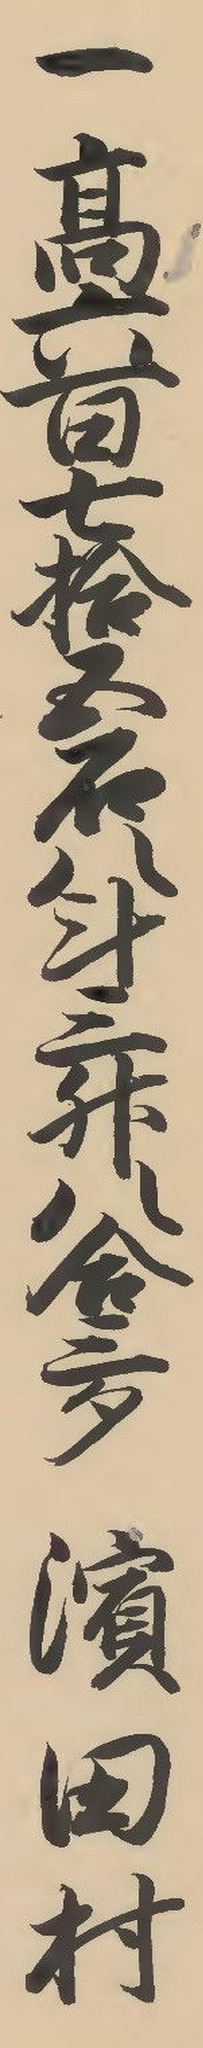一髙六百七拾五石八斗三升八合三夕濱田村
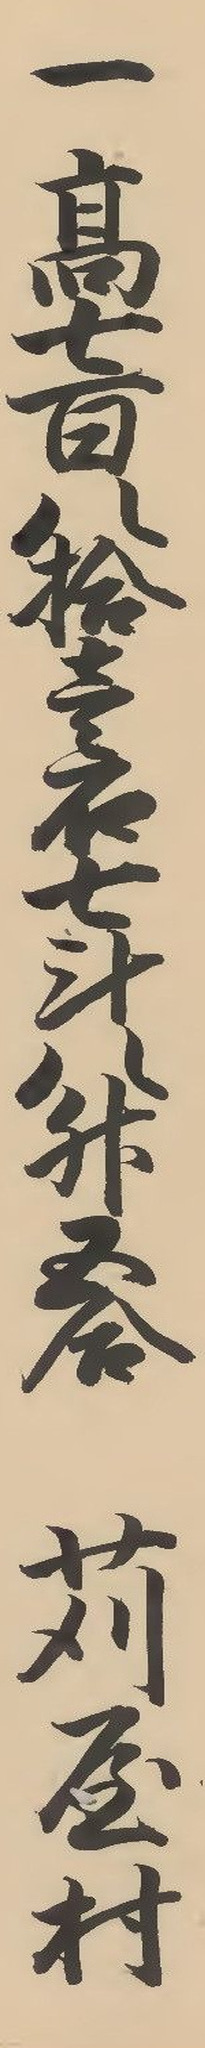一髙七百八拾壱石七斗八升五合苅谷村
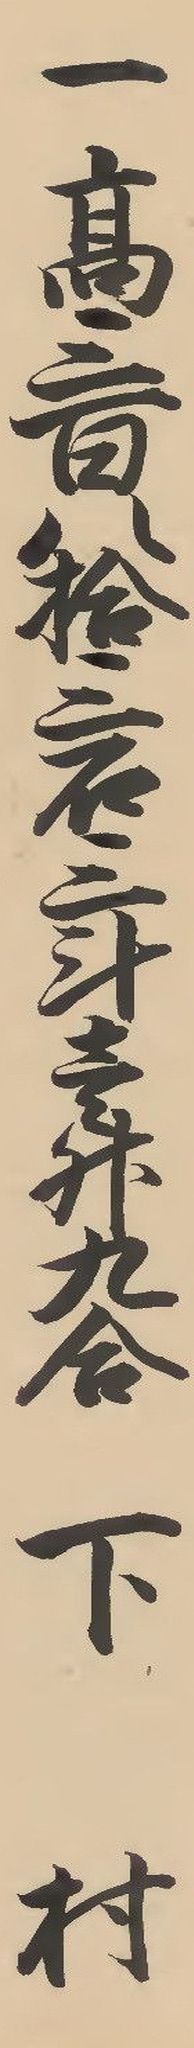一髙三百八拾三石三斗壱升九合下村
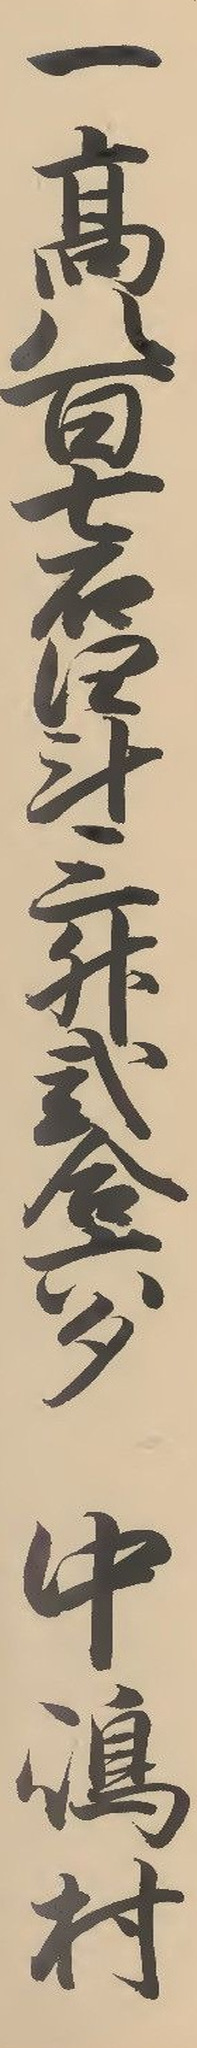一髙八百七石四斗三升弐合六夕中嶋村
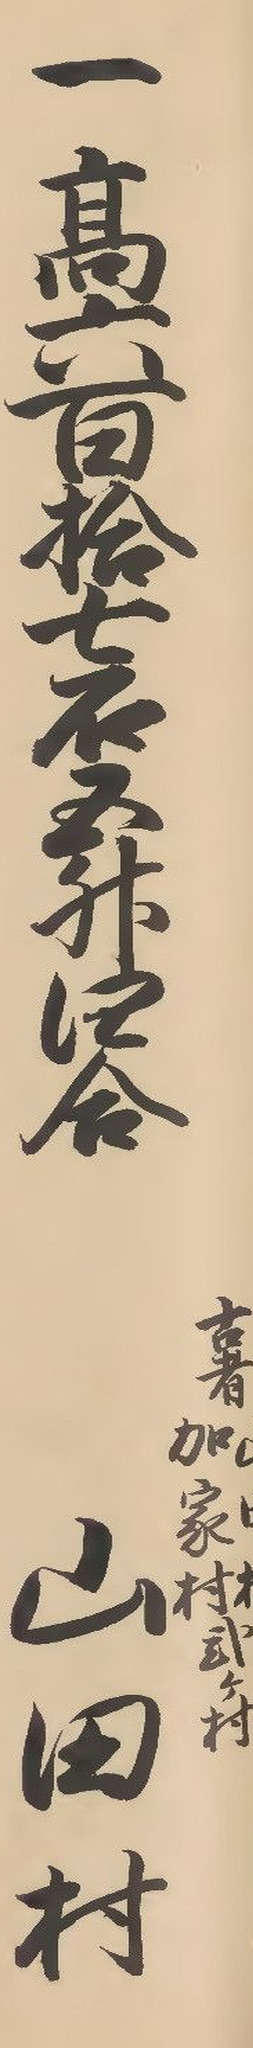一髙六百拾七石五升四合山田村
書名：播磨国郷帳
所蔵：国立公文書館 National Archives of Japan
